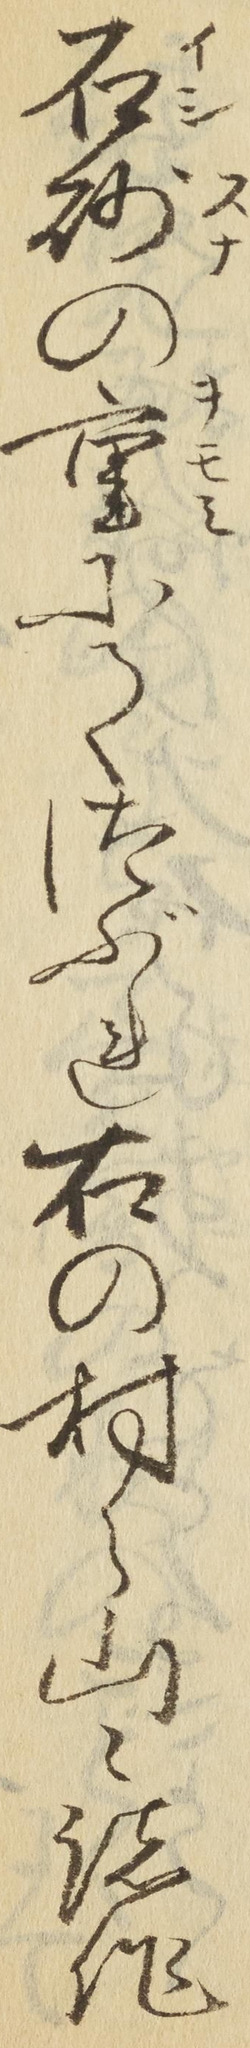石砂の重にてつふれ右の村〳〵山々諸作

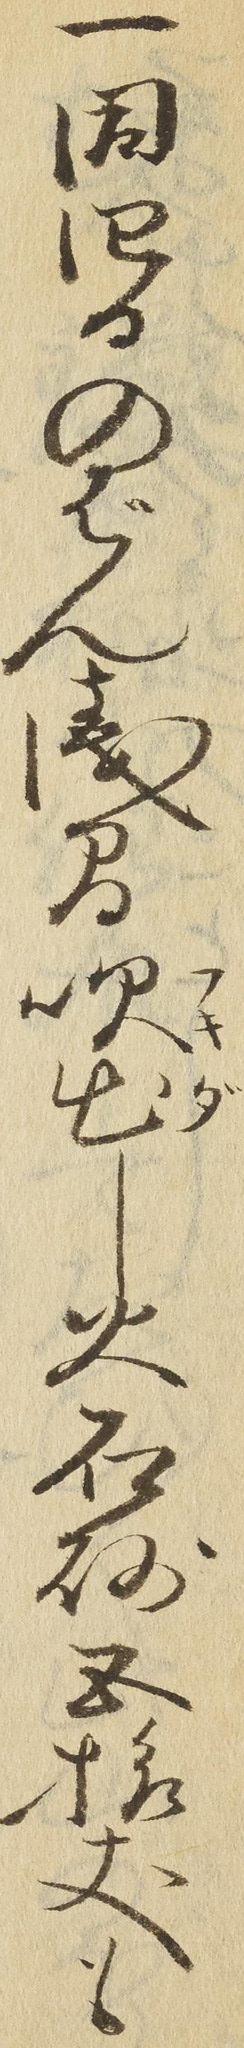一同四日のばん浅間吹出し火石砂五拾丈も
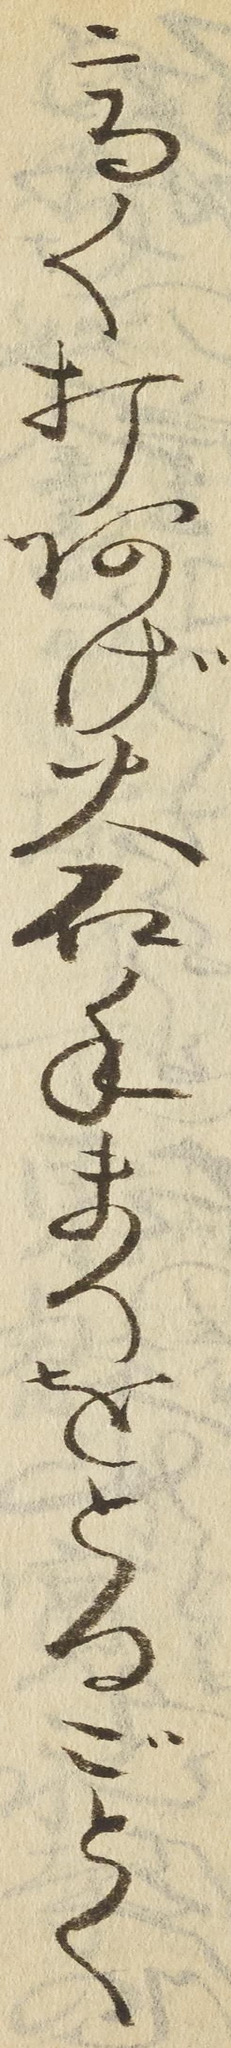高く打あげ大石手まりをとるごとく
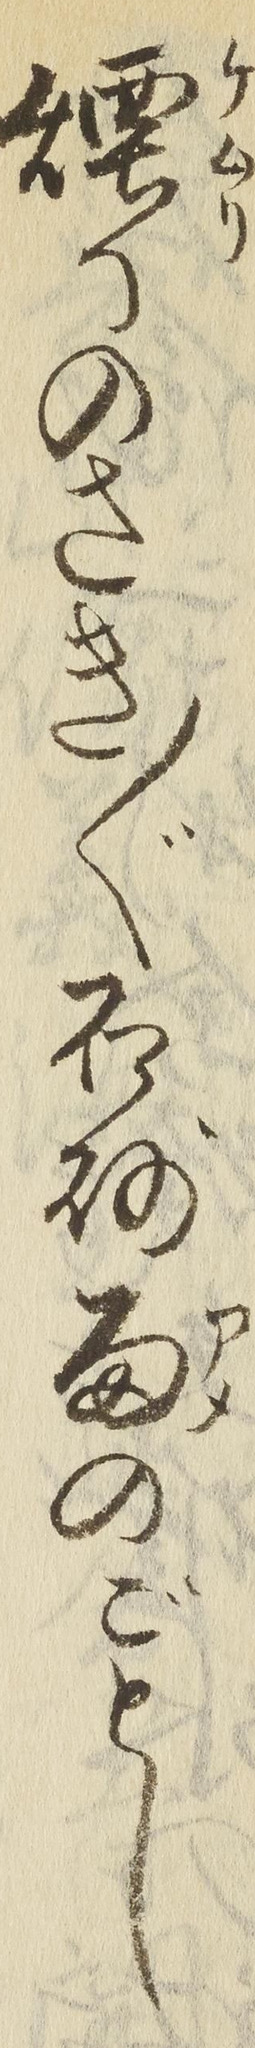煙のさき〳〵石砂雨のこよし
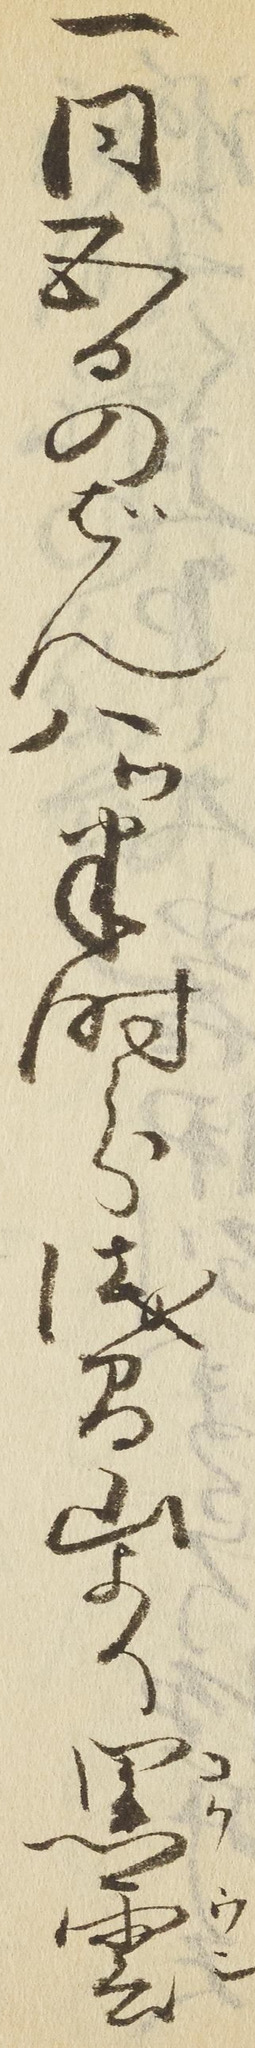一同五日のばん八ッ半時ゟ浅間山ゟ黒雲
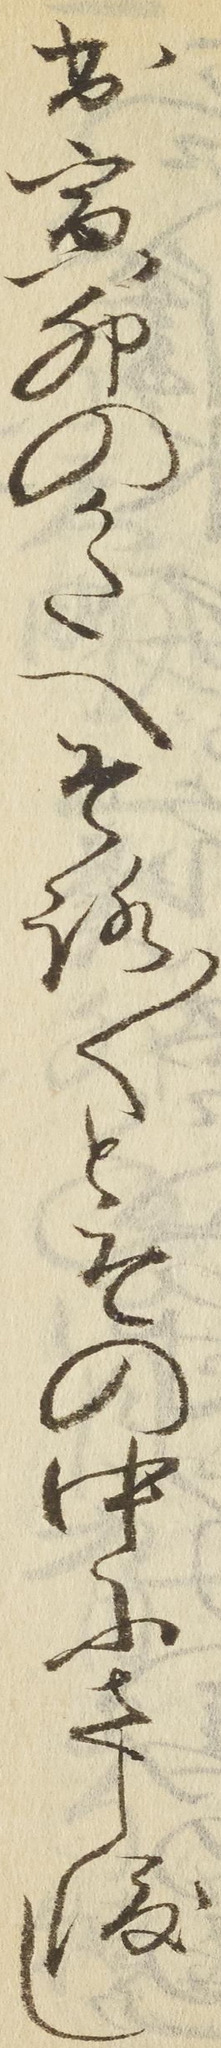出寅卯の方へそろ〳〵とその中にさし渡し
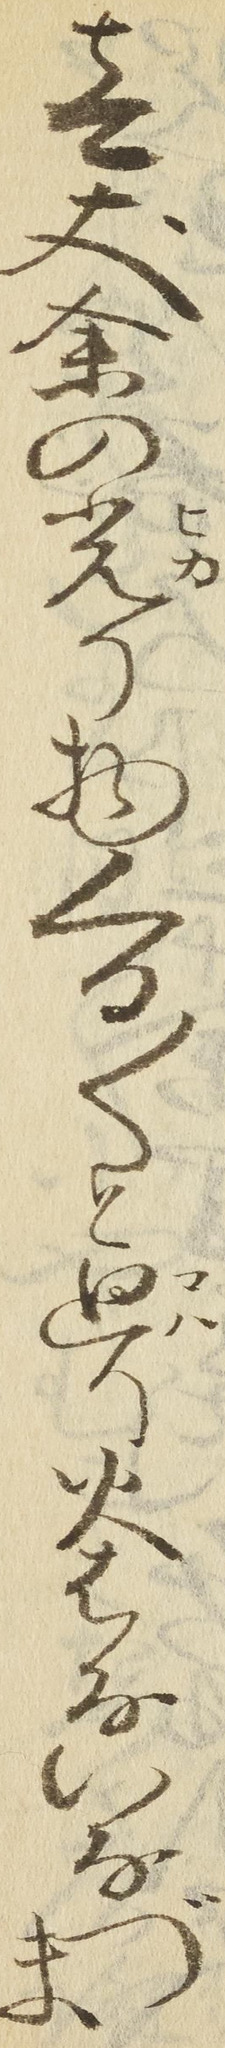壱丈余の光り物くる〳〵と廻り火はないなつま
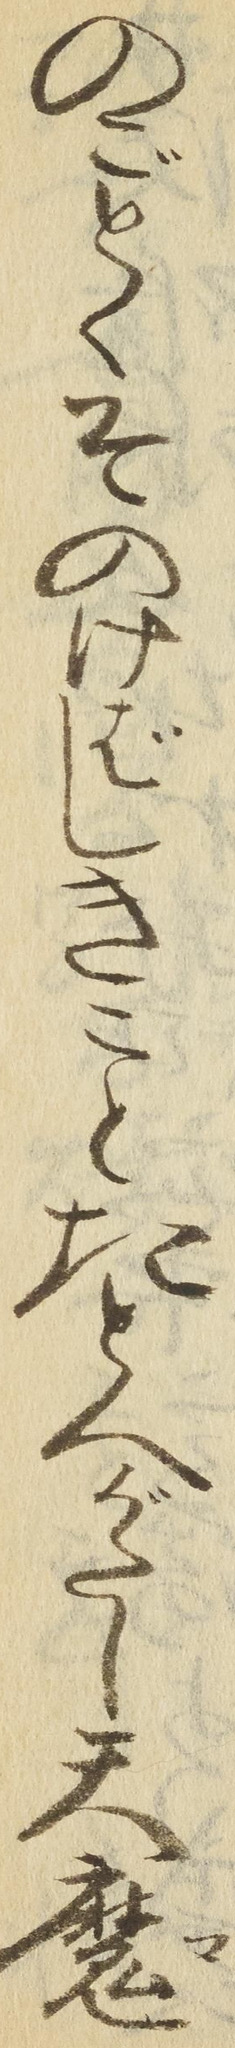のことくそのけはしきことたとへがたし天魔
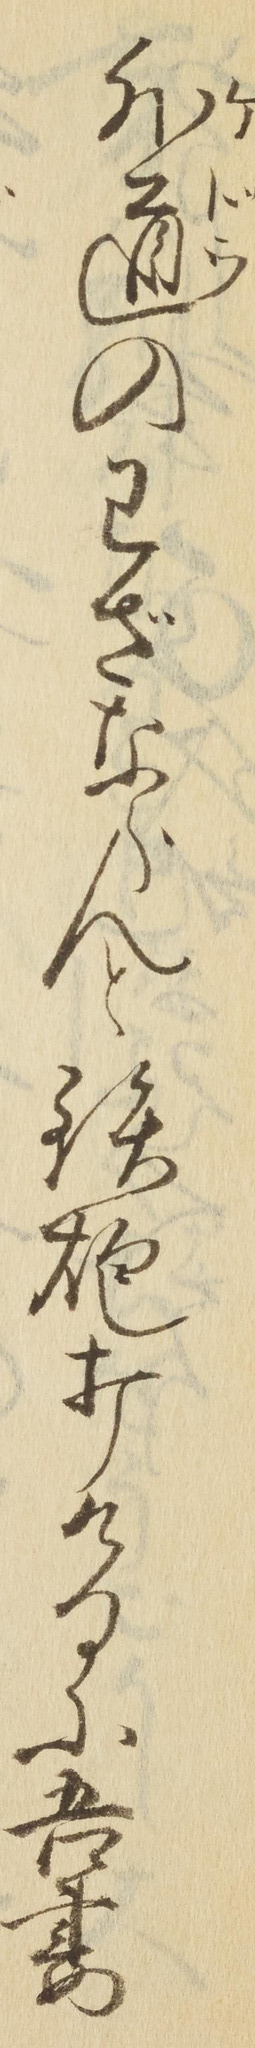外道のわざならんと鉄炮打けるに吾妻
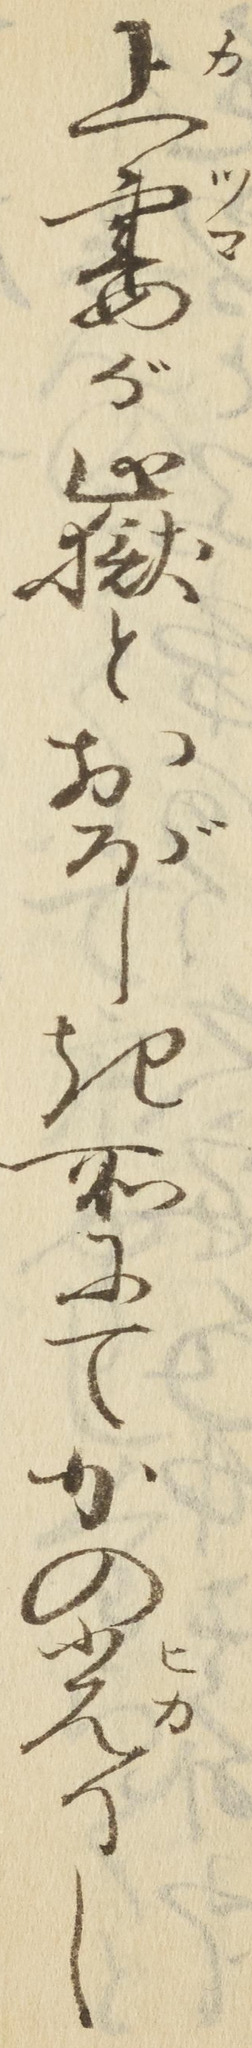上妻が嶽とおぼしき所にてかの光りし
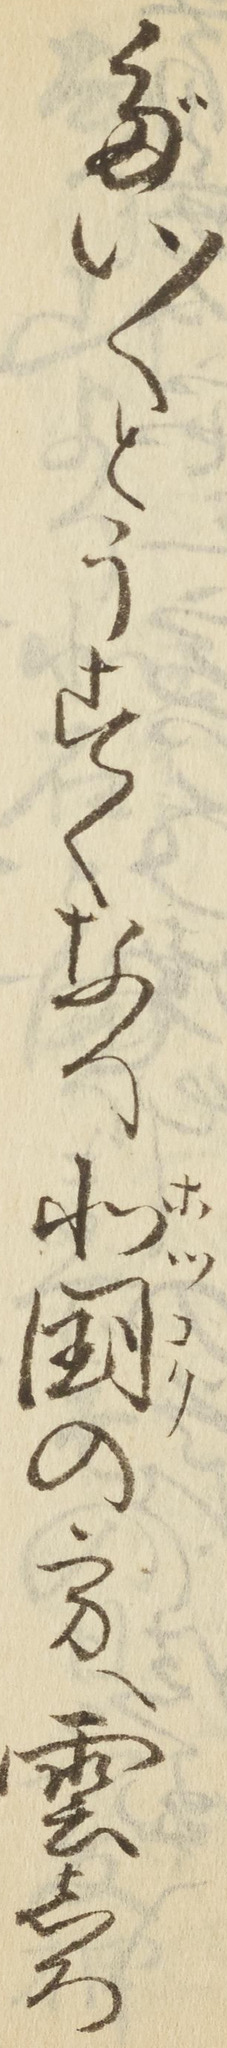だい〳〵とうすくなり北国の方へ雲しろ
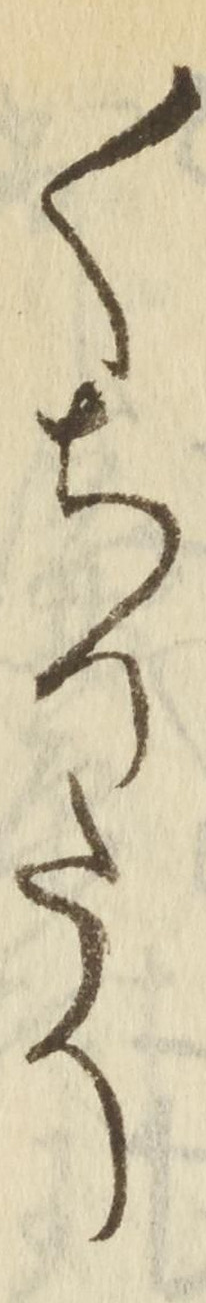くちりたり
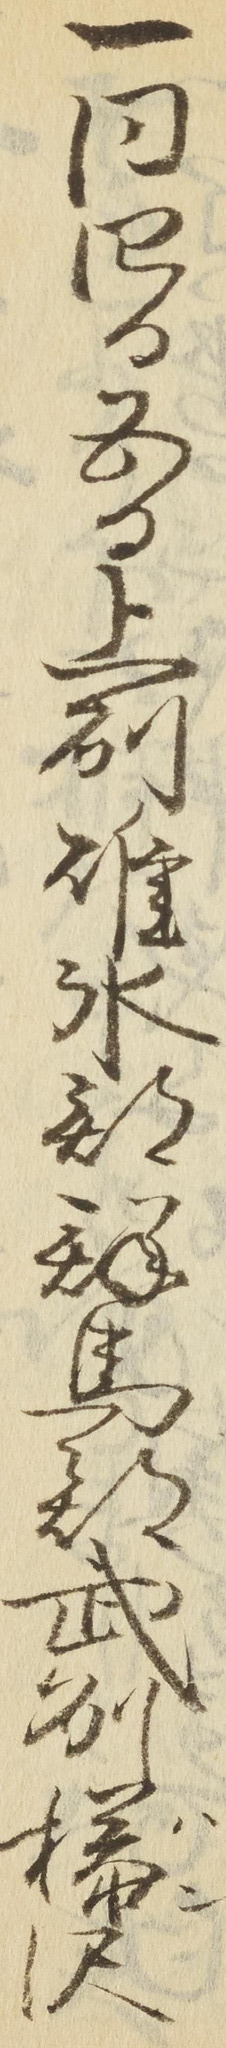一同四日五日上州碓氷郡群馬郡武州榛沢
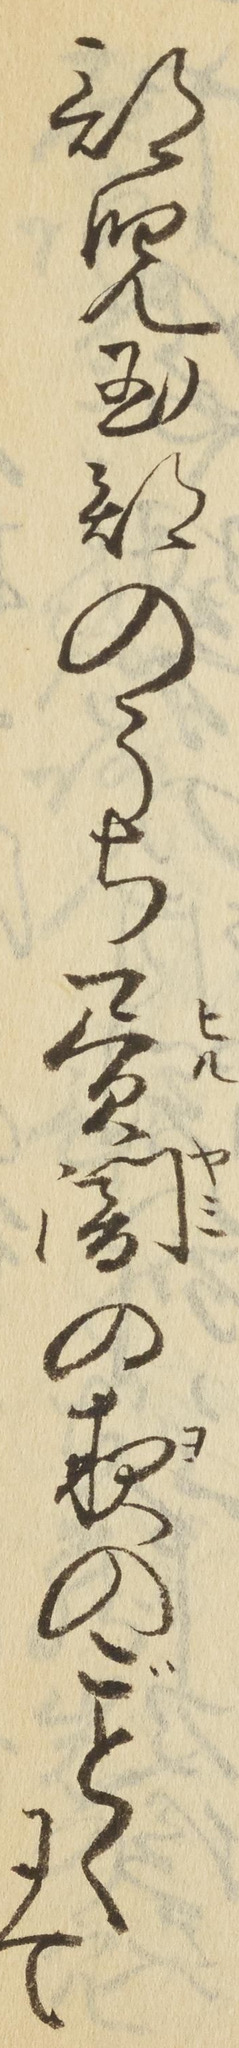郡児玉郡のうち昼闇の夜のことくにて
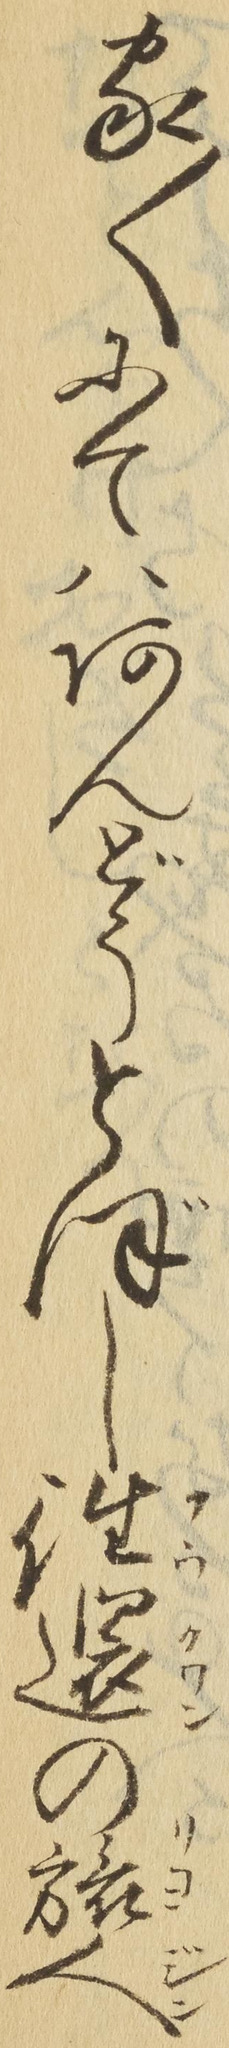家々にてはあんどうとぼし往還の旅人

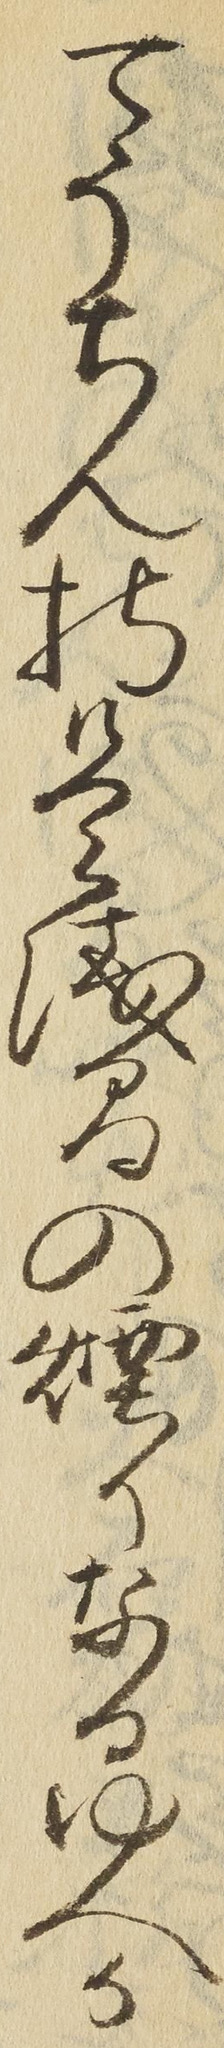てうちん持ける浅間の煙りなるゆへか
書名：浅間大變記
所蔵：東京大学地震研究所図書室 Earthquake Research Institute Library, The University of Tokyo, JAPAN
